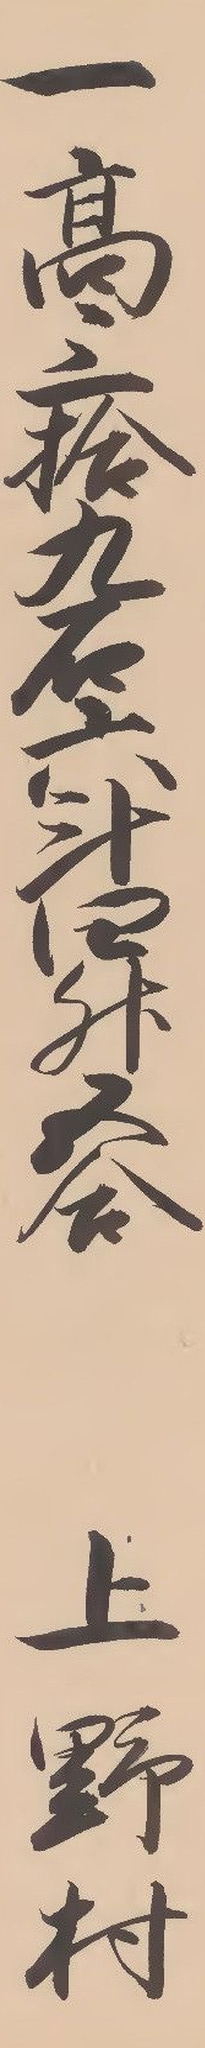一高三拾九石六斗四升五合上野村
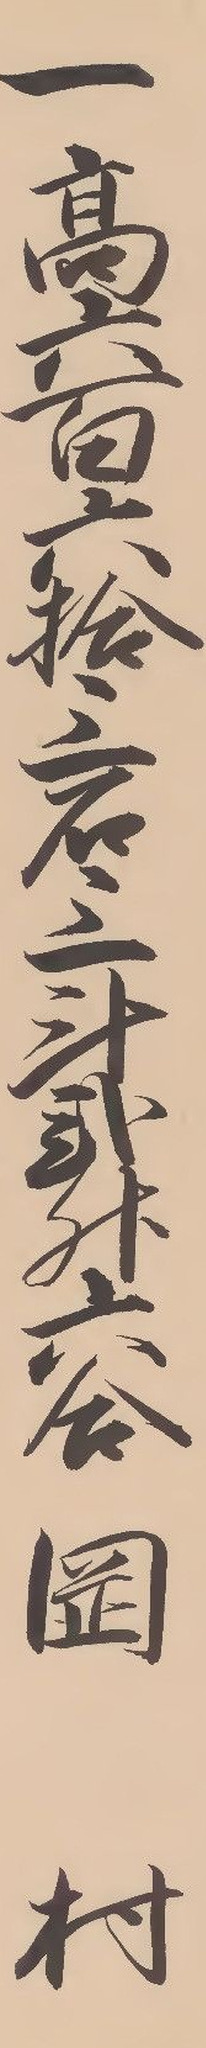一高六百六拾三石三斗弐升六合岡村
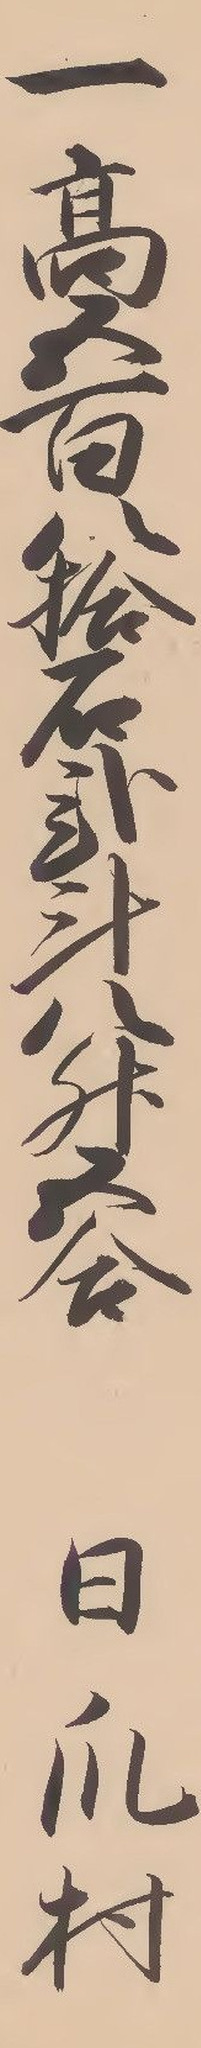一高五百八拾石弐斗八升五合日爪村

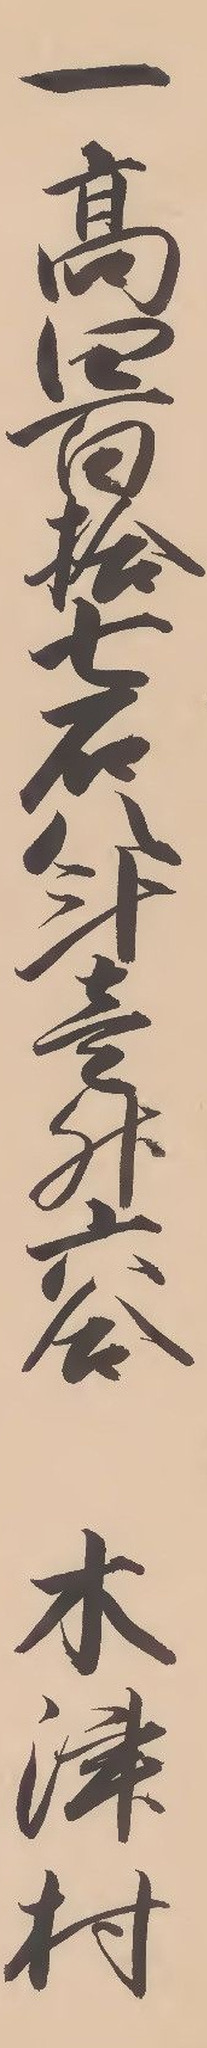一高四百拾七石八斗壱升六合木津村
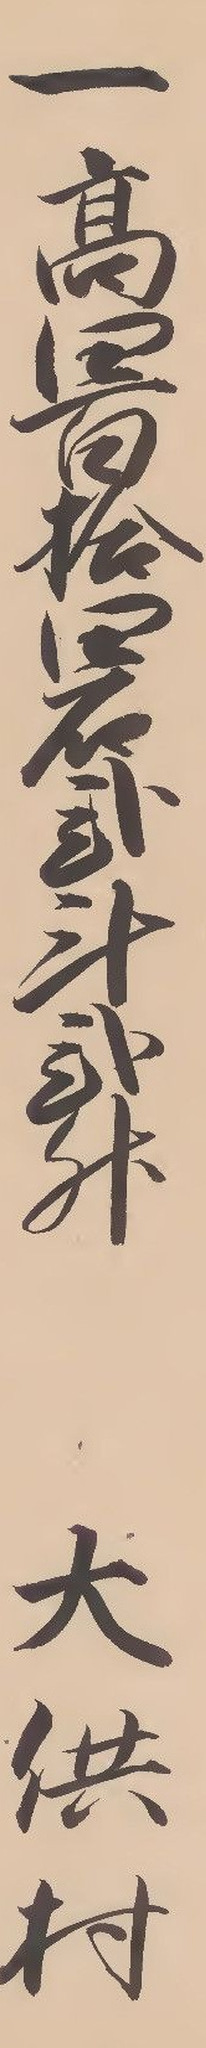一高四百拾四石弐斗弐升大供村
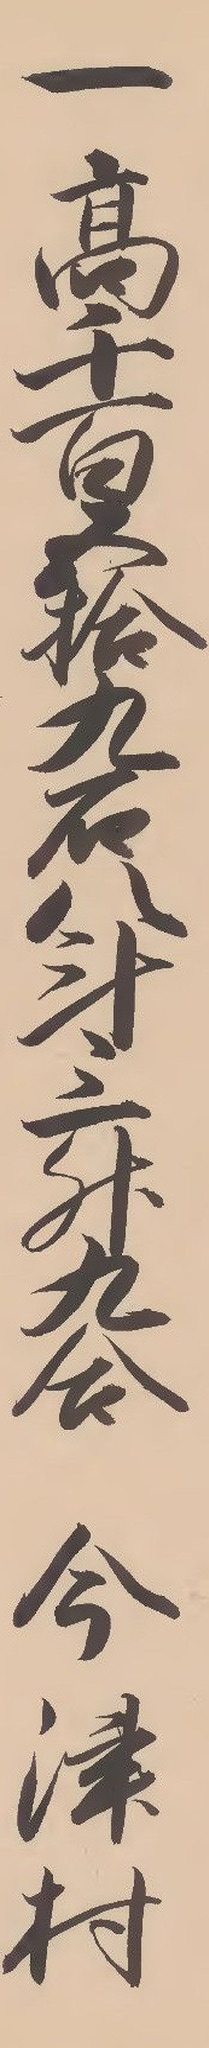一高千百五拾九石八斗三升九合今津村
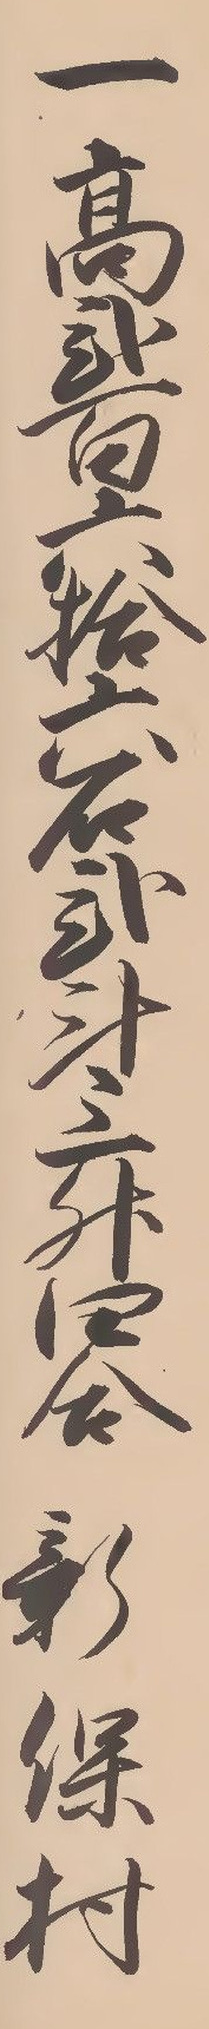一高弐百六拾六石弐斗三升四合新保村
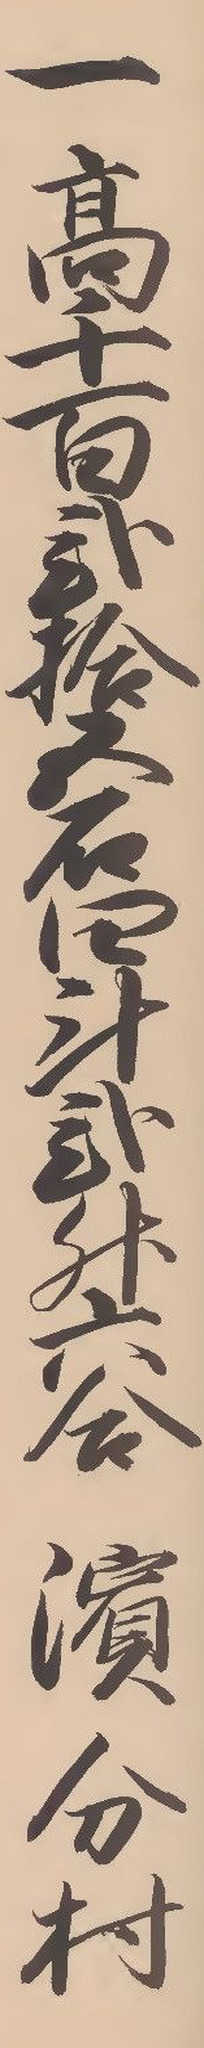一高千百弐拾五石四斗弐升六合浜分村
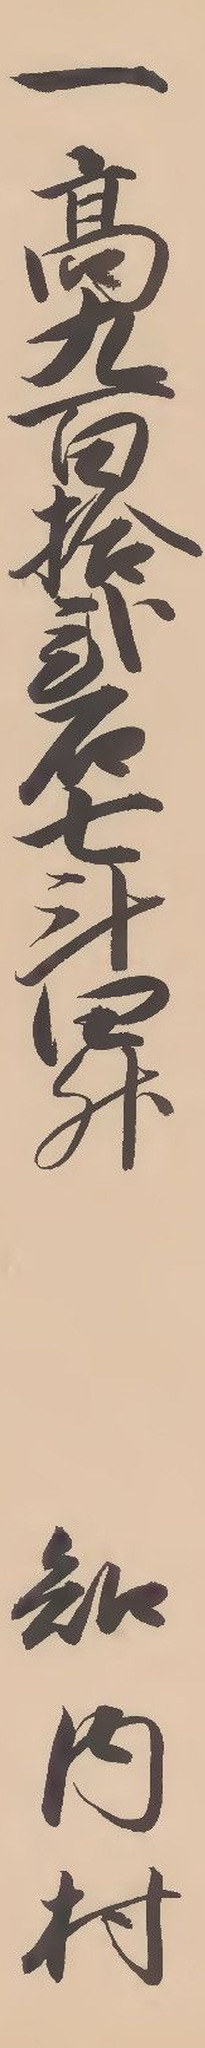一高九百拾弐石七斗四升知内村
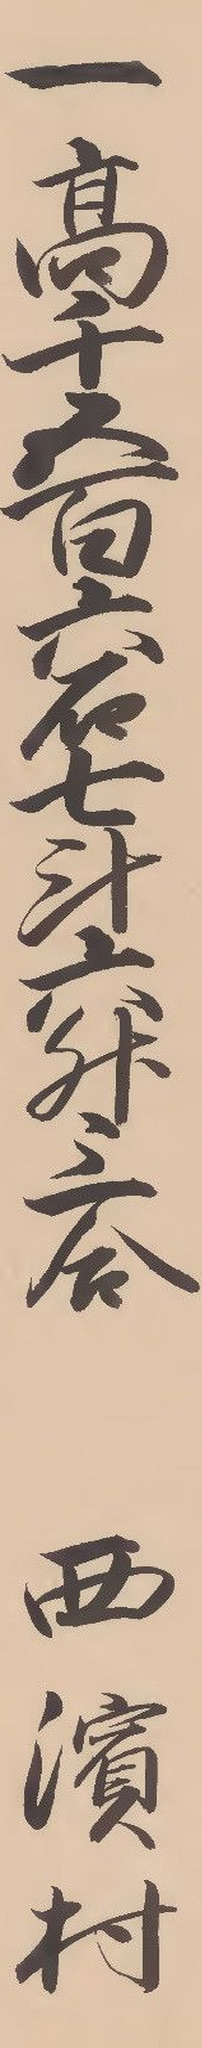一高千五百六石七斗六升三合西浜村
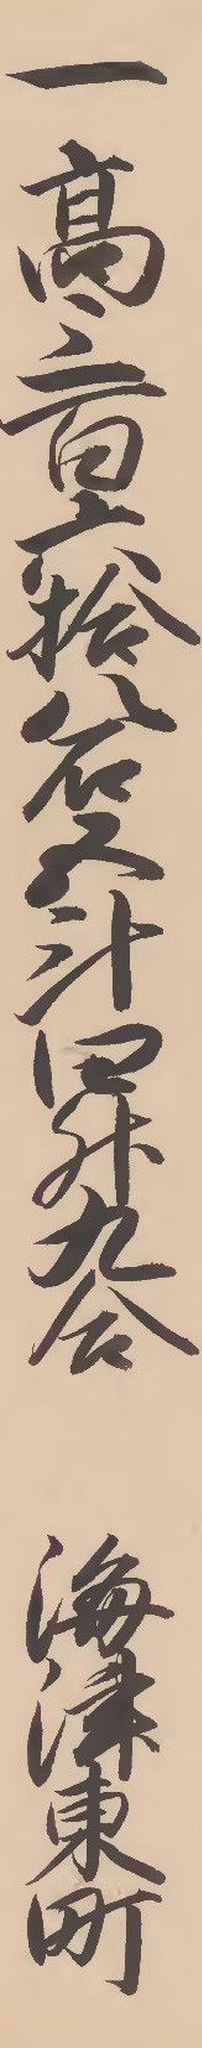一高三百六拾八石五斗四升九合海津東町

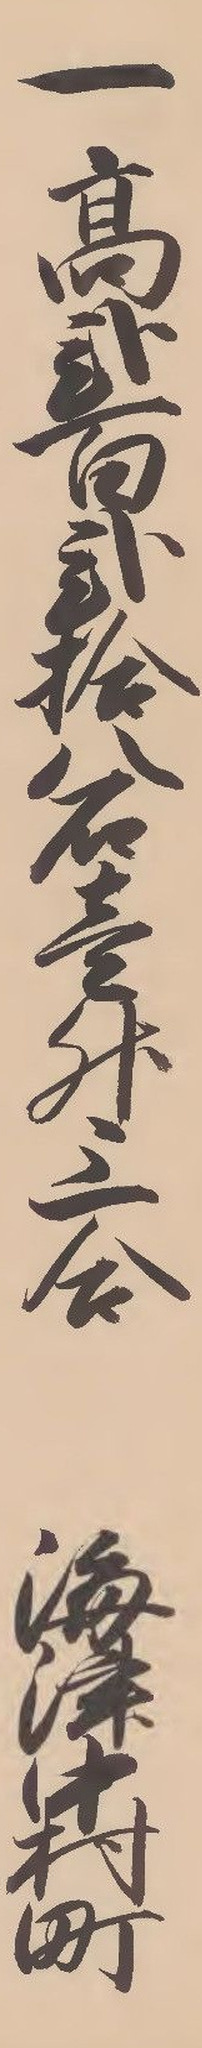一高弐百弐拾八石壱升三合海津中村町
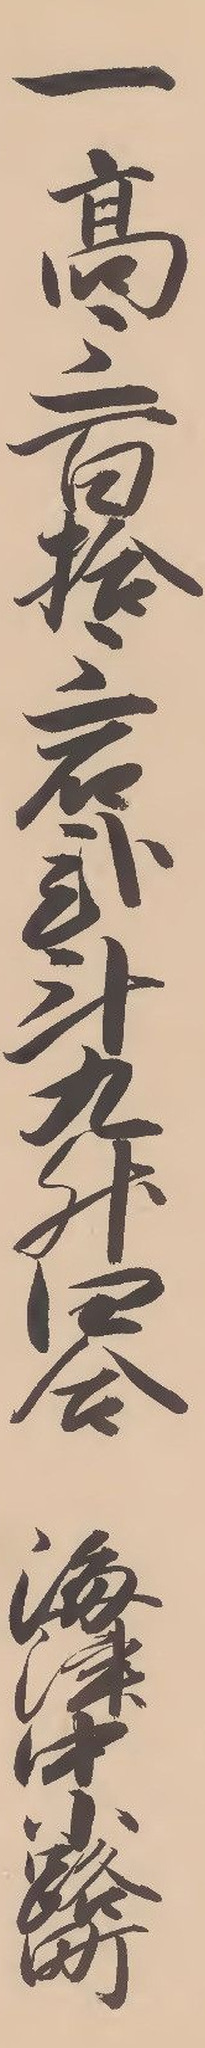一高三百拾三石弐斗九升四合海津中小路町
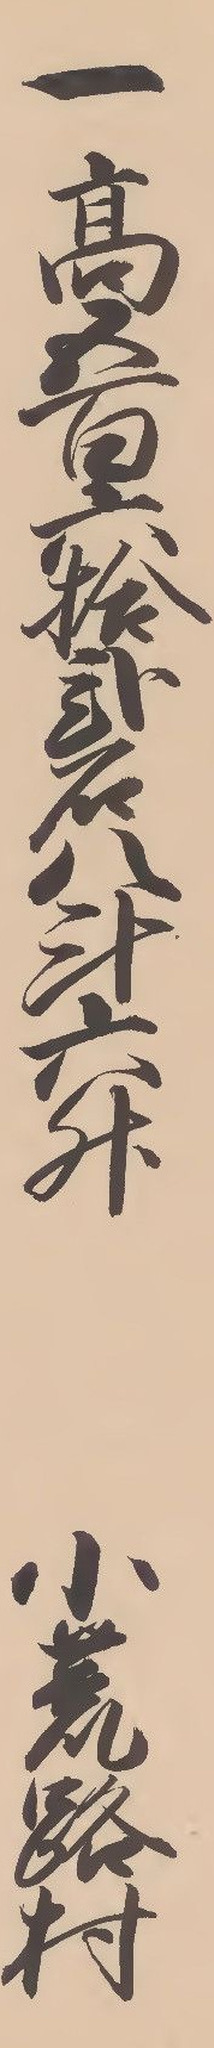一高五百六拾弐石八斗六升小荒路村
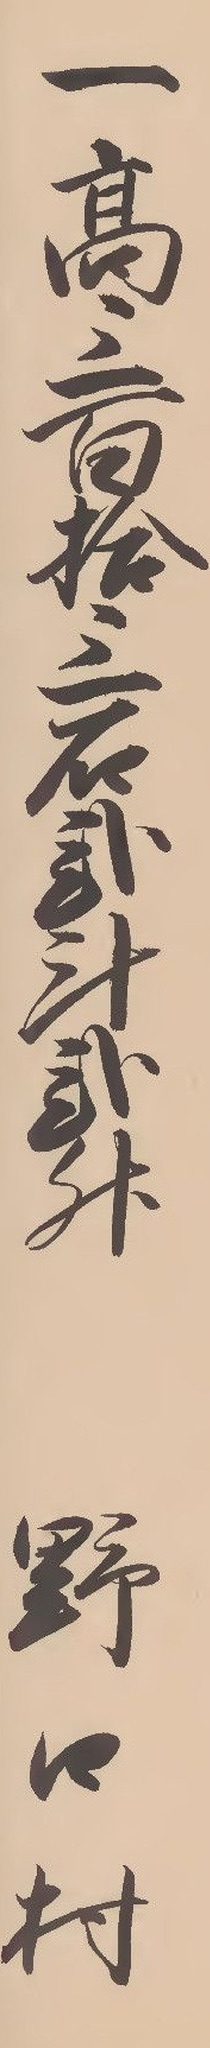一高三百拾三石弐斗弐升野口村
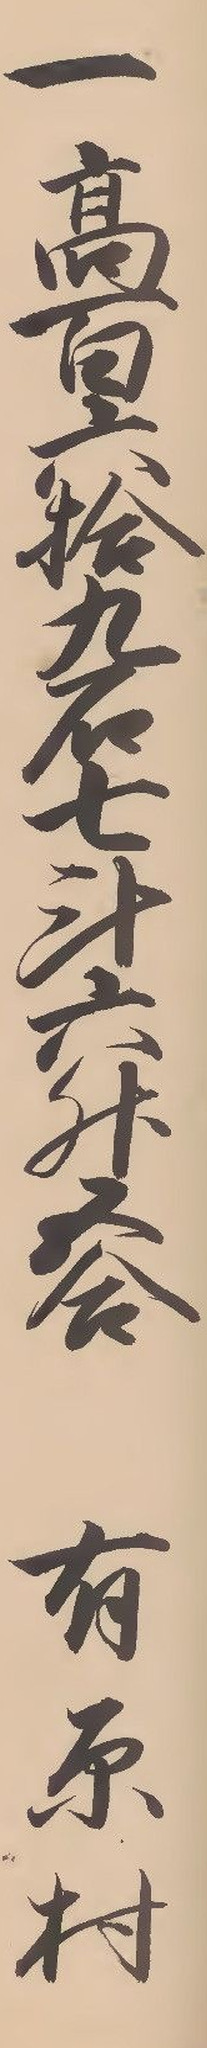一高百六拾九石七斗六升五合有原村
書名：近江国郷帳
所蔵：国立公文書館 National Archives of Japan
